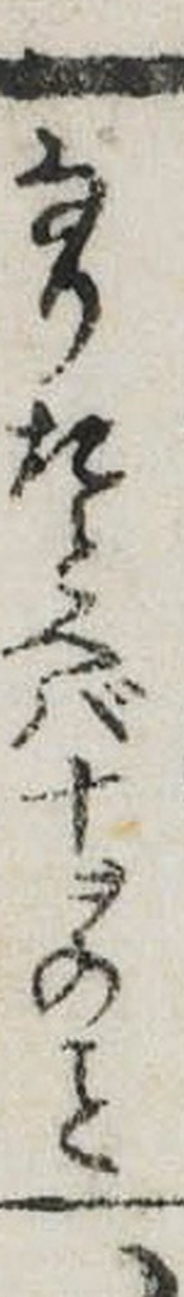なりたとへば十ヲのこと
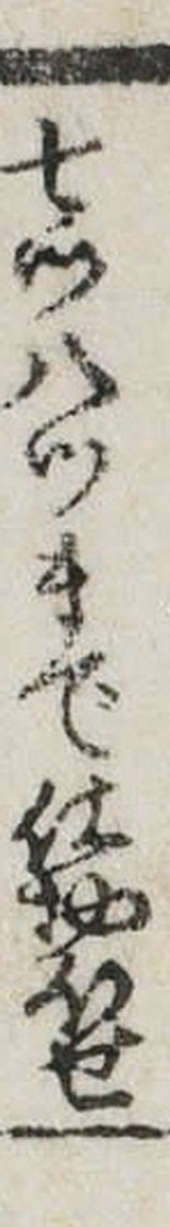七ツ八ツまで仕おほせ
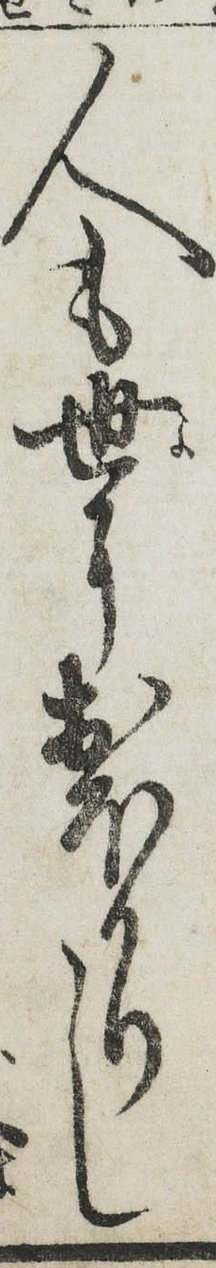人も世におほかりし
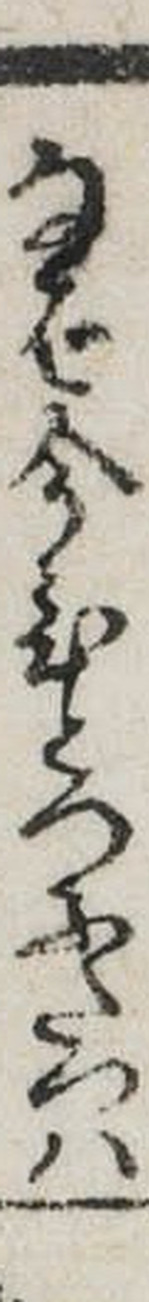なば今ひとつふたつは
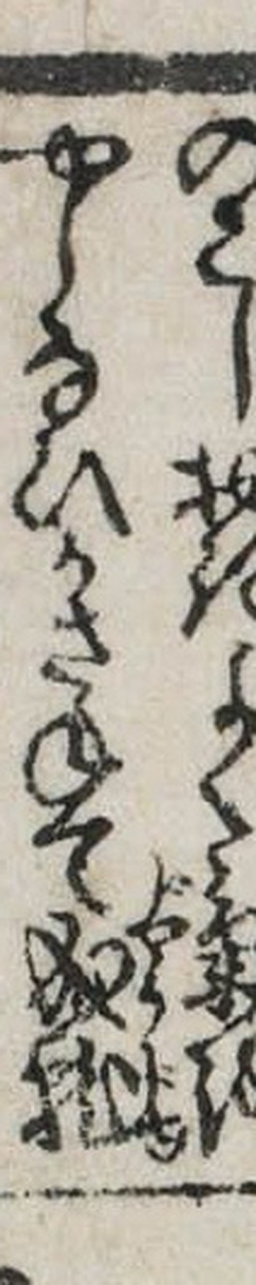やしなひかさねて成就
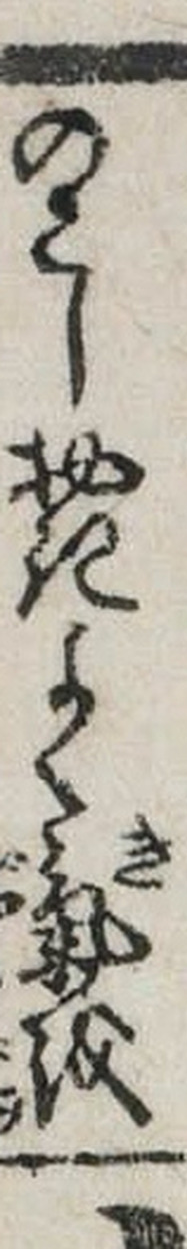のこしおきよく気を
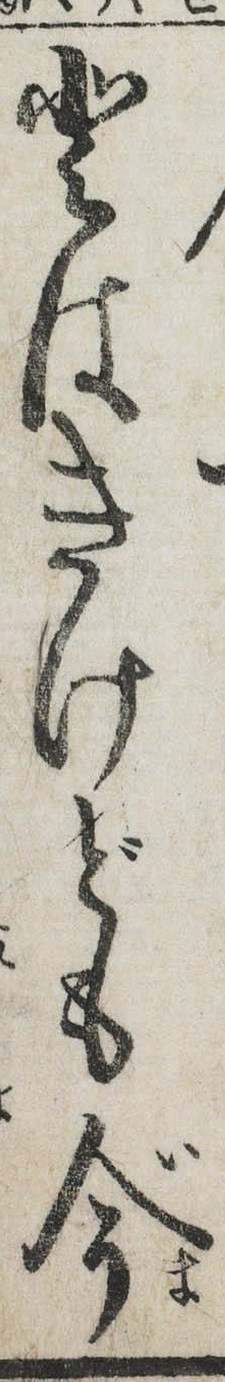とはきけども今
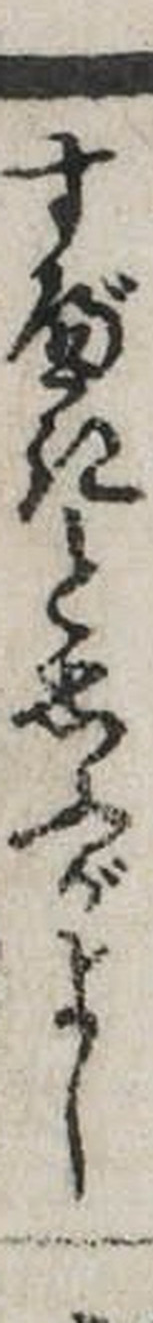すべきと思ふがよし
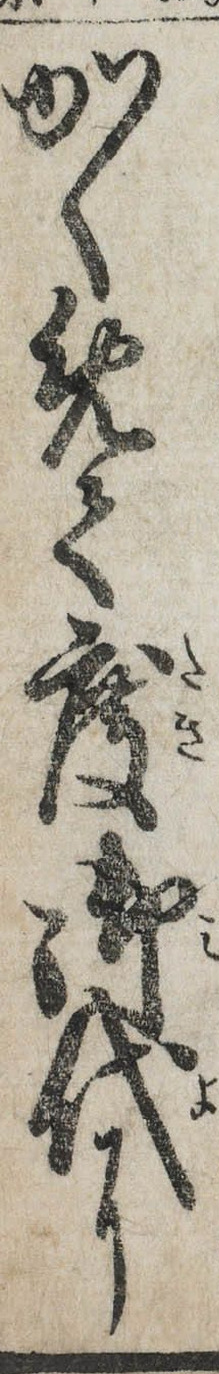かくめて度御代に

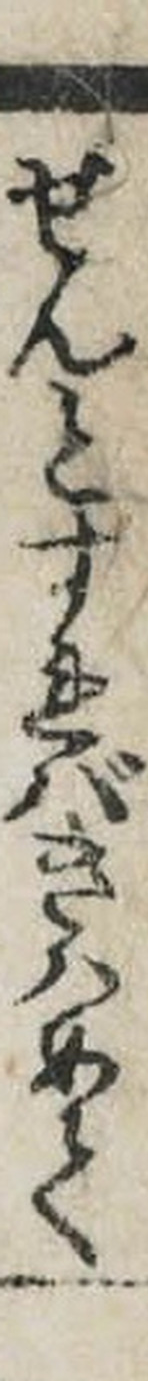せんとすればきはめて
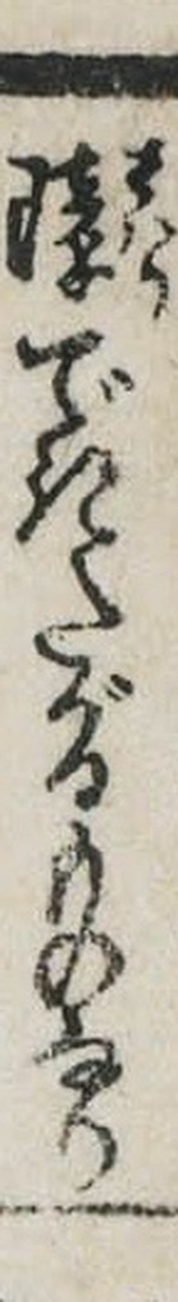障できたがるものなり
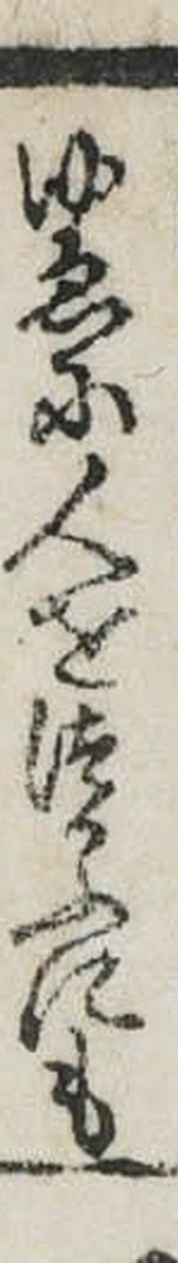ゆゑに人をつかふにも
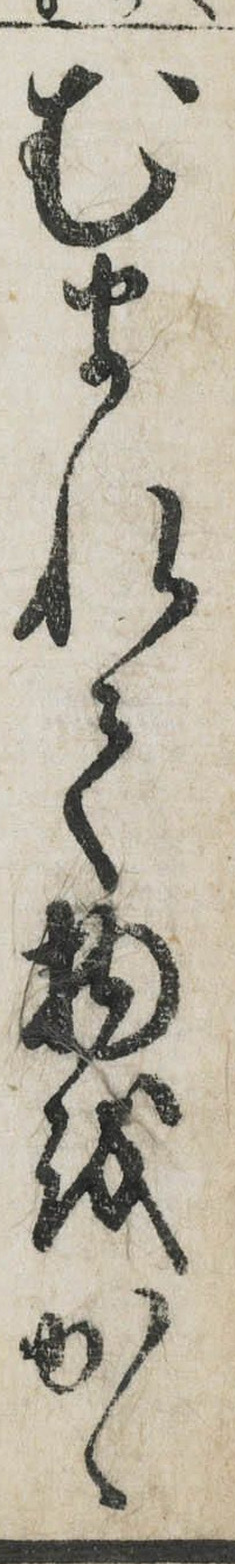むまれて物をかゝ
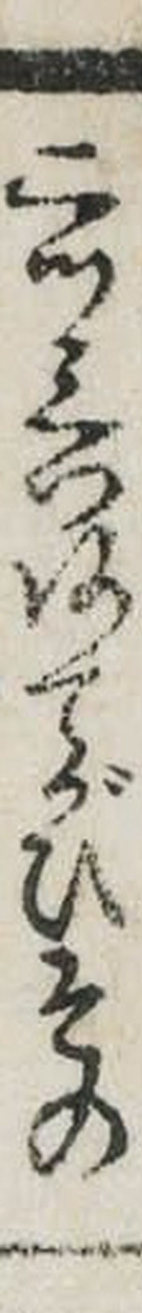二ツ三ツあてがひその
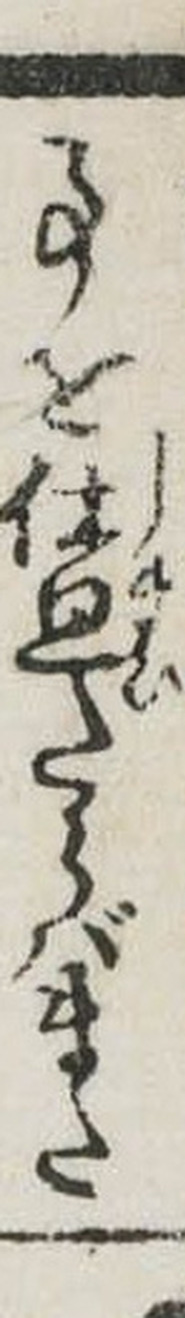事を仕廻たらばまた
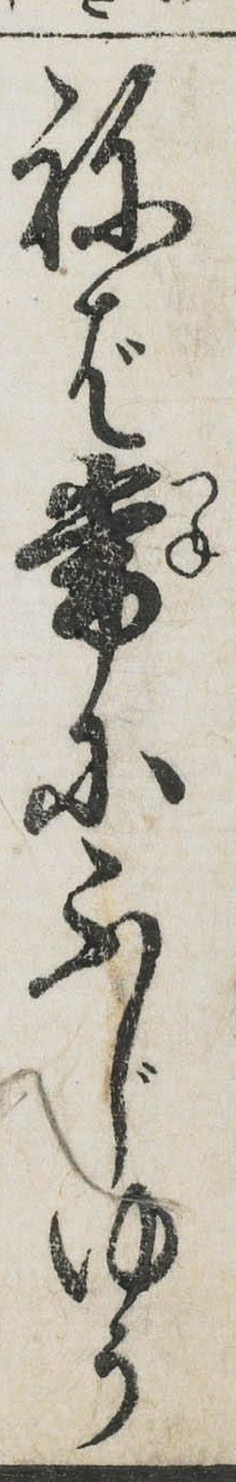ねば常にふじゆう
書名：頭書萬用婦人手紙之文言
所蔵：東京学芸大学教育コンテンツアーカイブ
